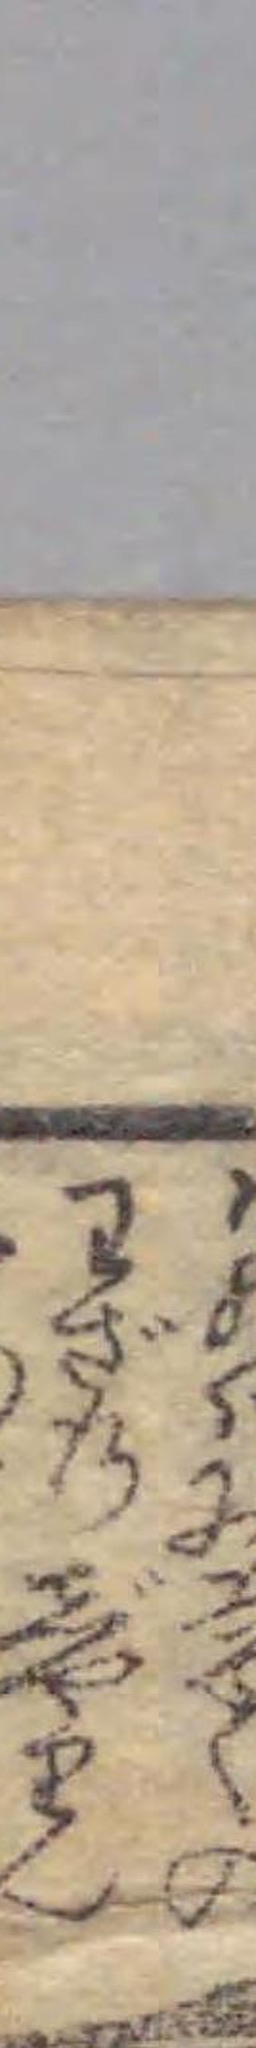わざのじやりん
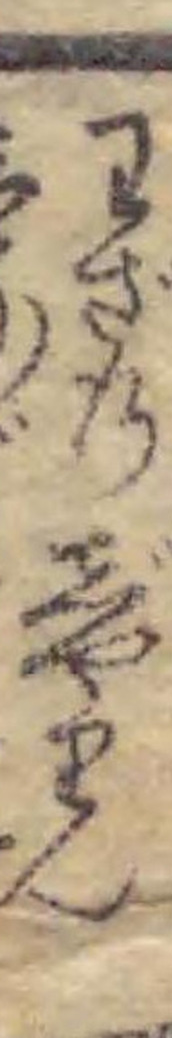わざのじやりん
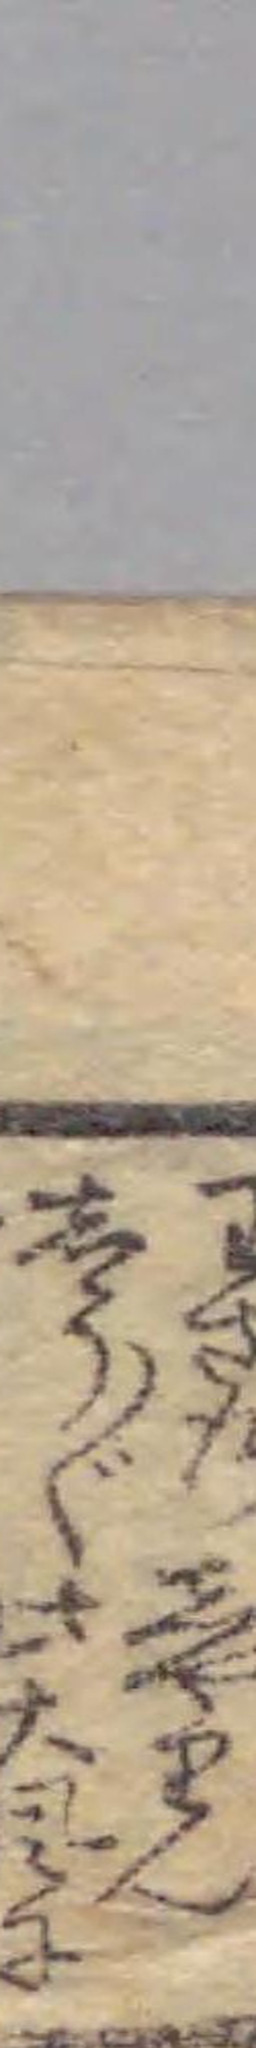しう〴〵此大風に
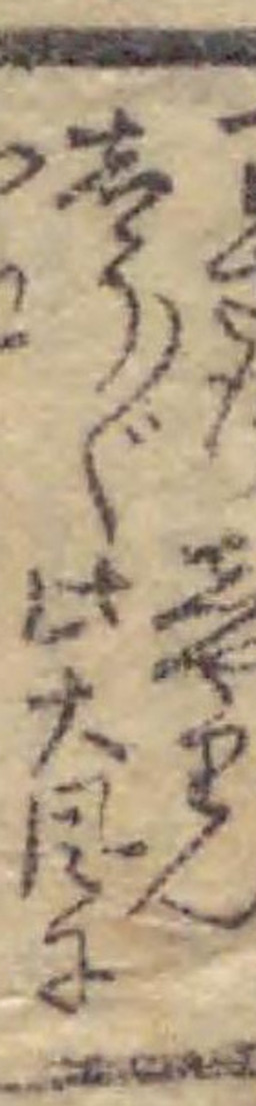しう〴〵此大風に
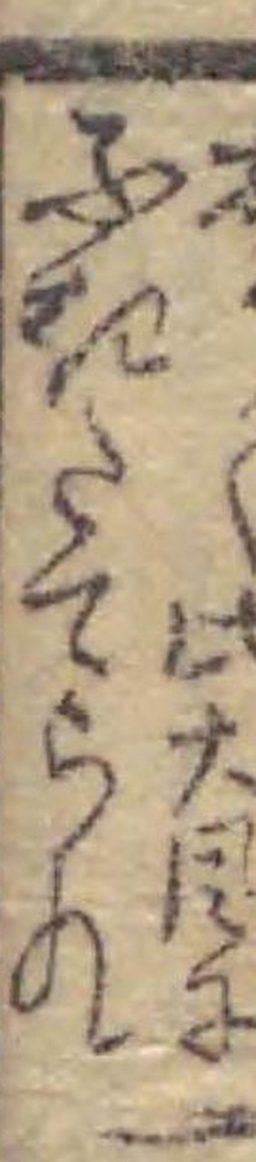ふきたてられ
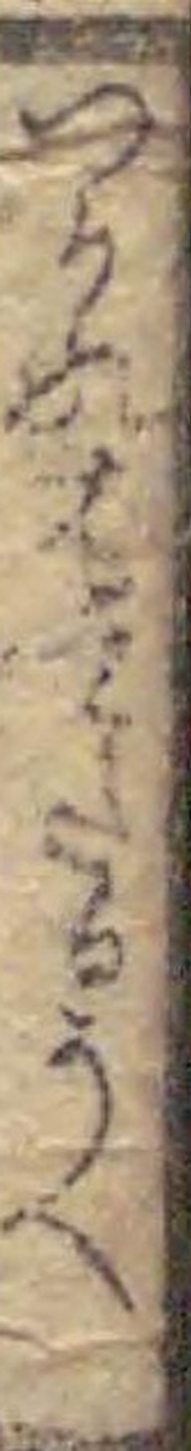つかれはてたるうへ
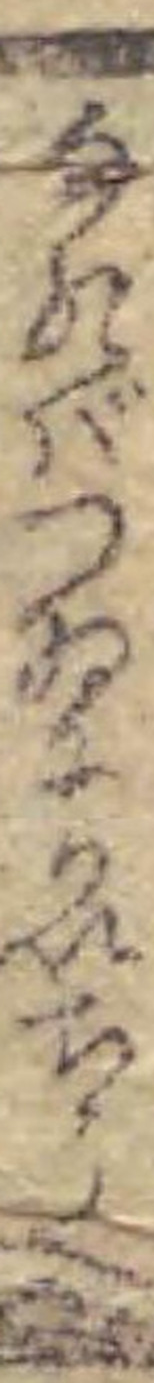なればつゐにかいちうへ
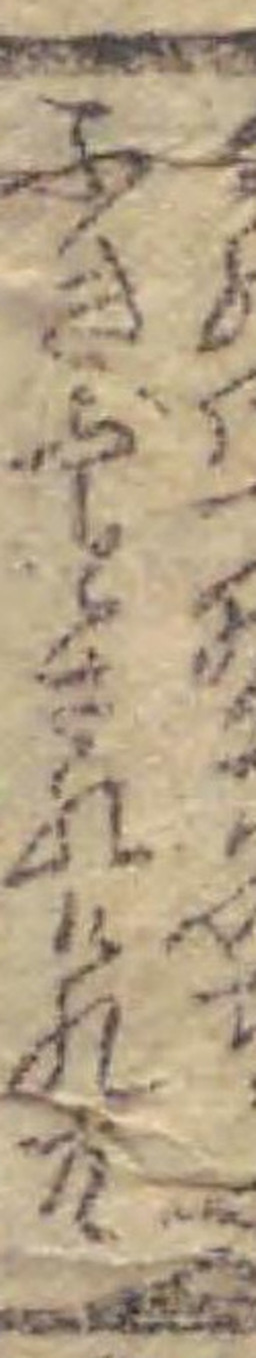ふきおとされけれ共
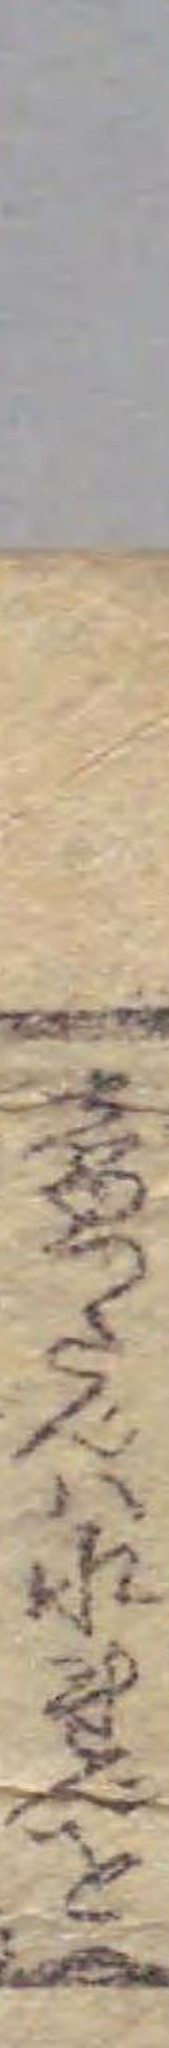しゆつたんは水れんを
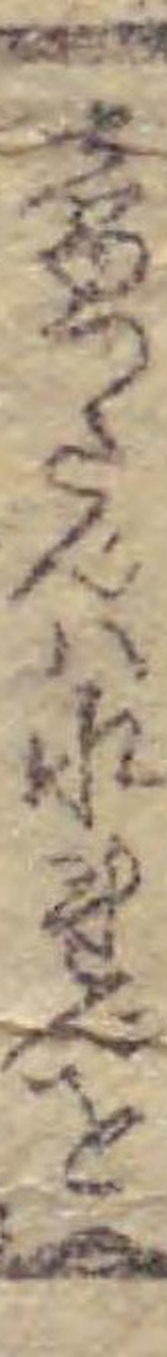しゆつたんは水れんを
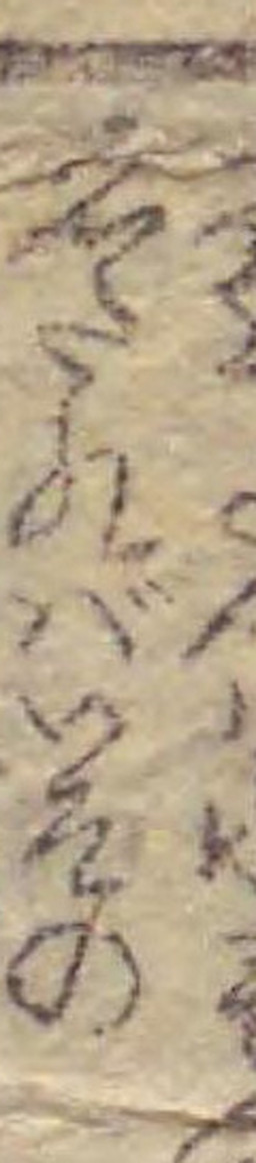ゑたればいその
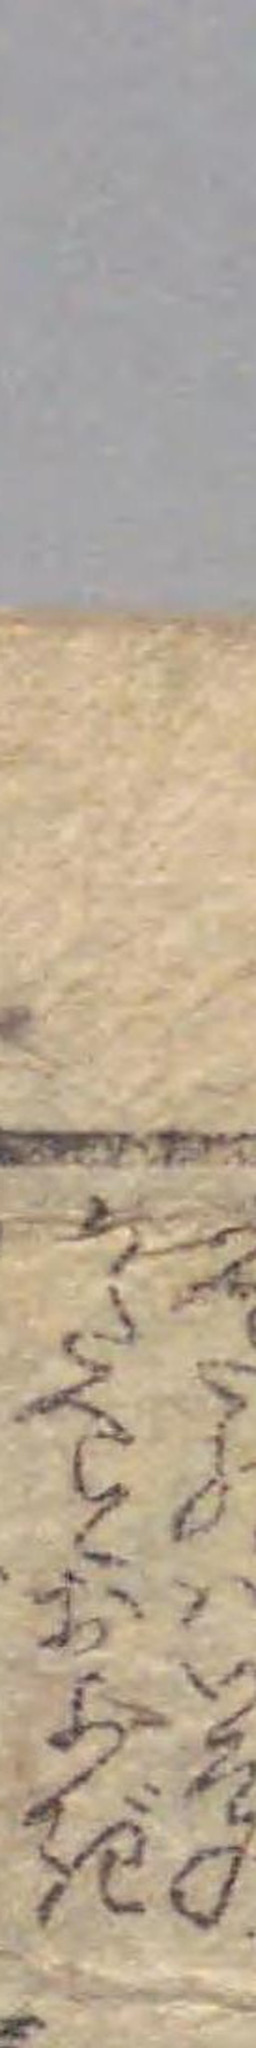かたへとおよぎ
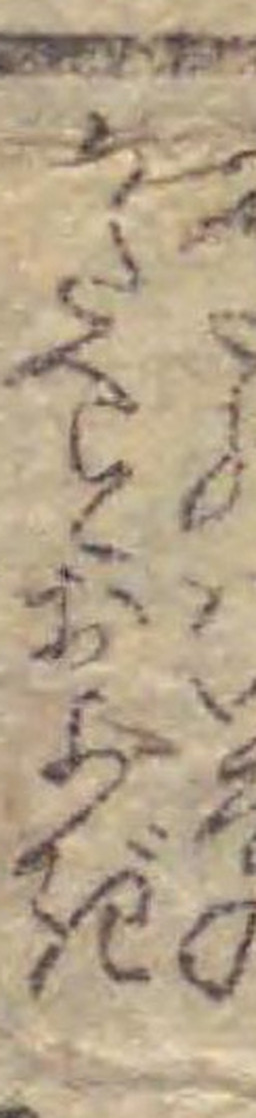かたへとおよぎ
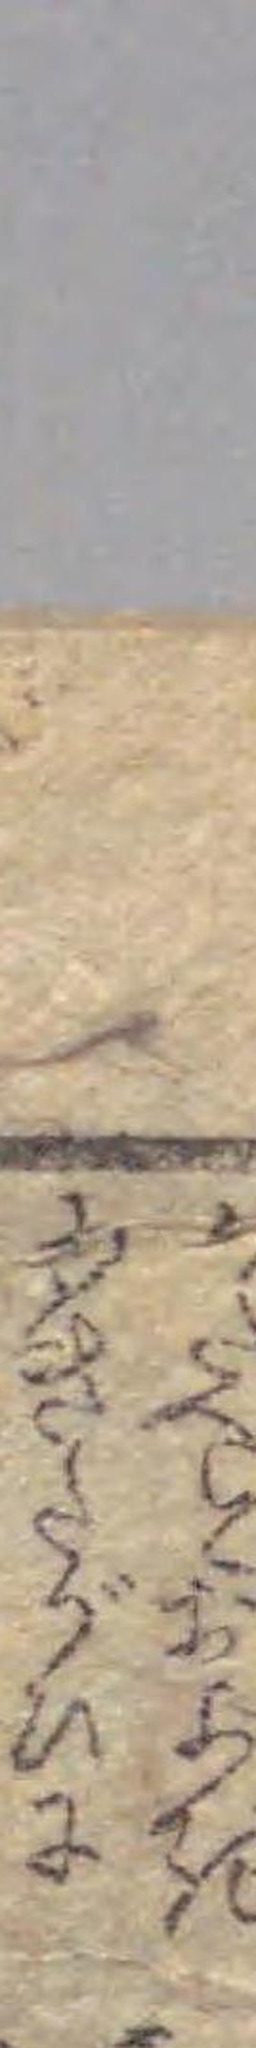ゆきたがひに
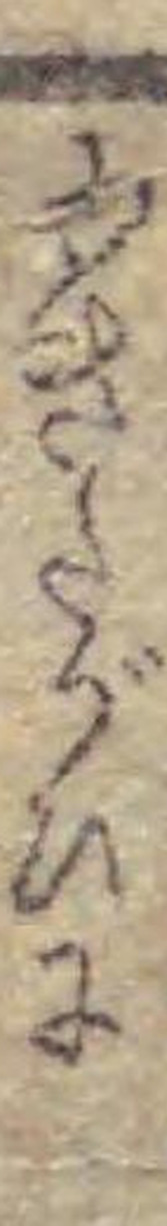ゆきたがひに
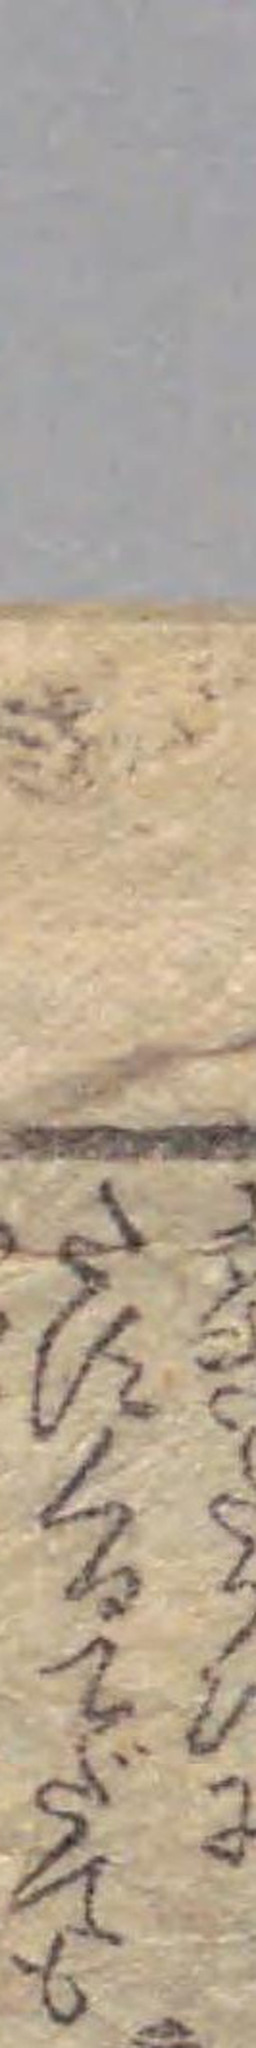たすくるてだても
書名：化物世界夜半嵐 : 3巻
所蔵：国立国会図書館 National Diet Library, JAPAN
